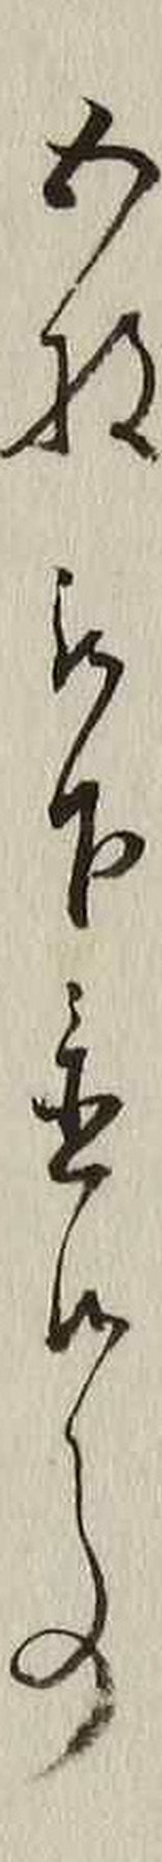五枚被下置候事
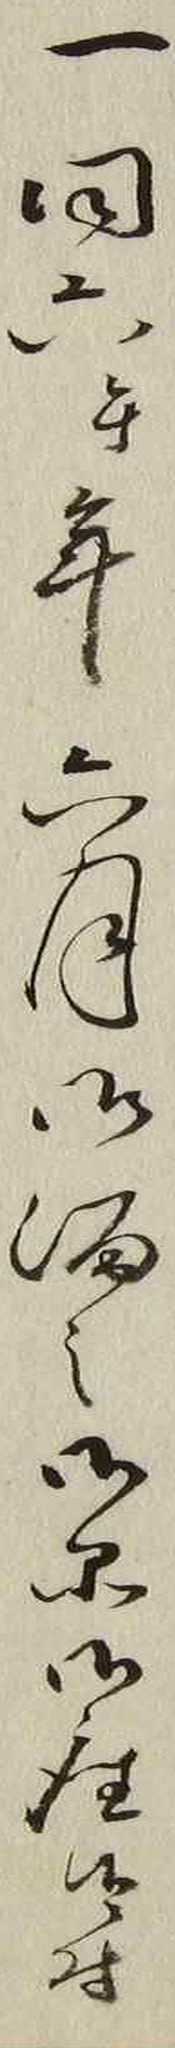一同六午年六月御溜之御品御座候ニ付
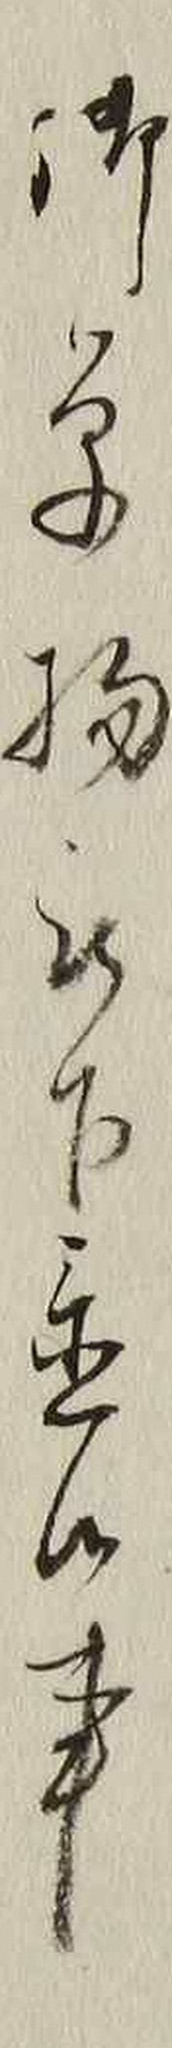御単物被下置候事
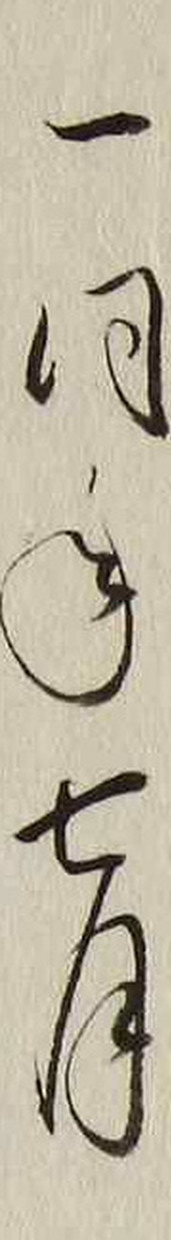一同年七月
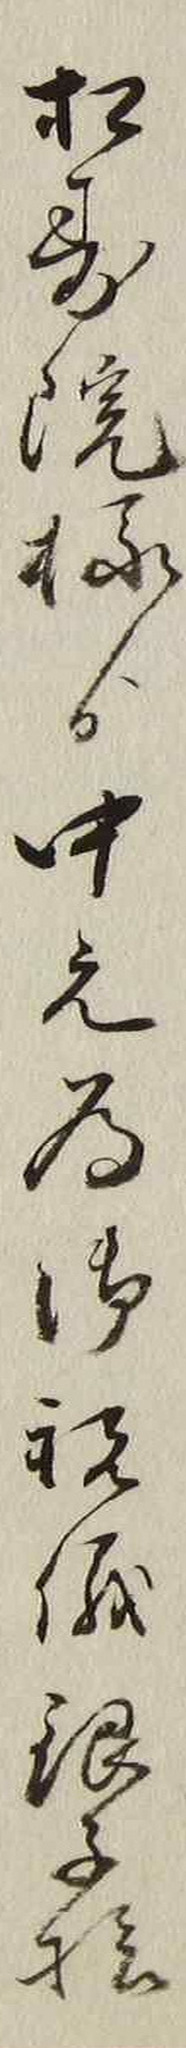松寿院様より中元為御祝儀銀子拾
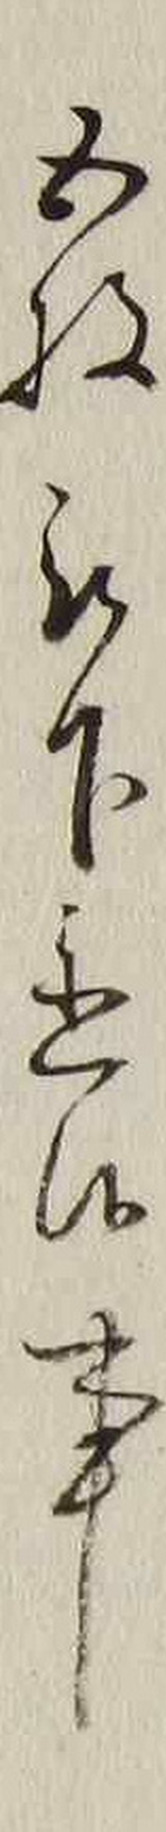五枚被下置候事
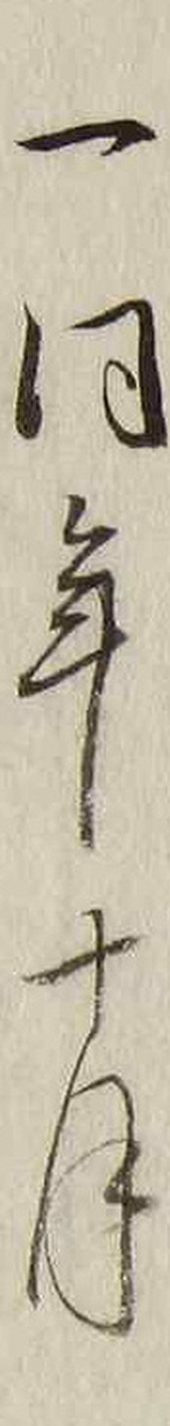一同年十月
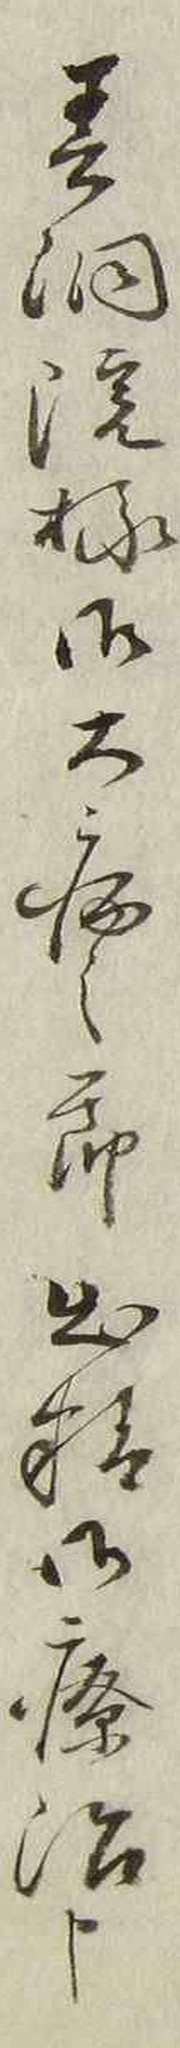春洞院様御大病之節出精御療治申

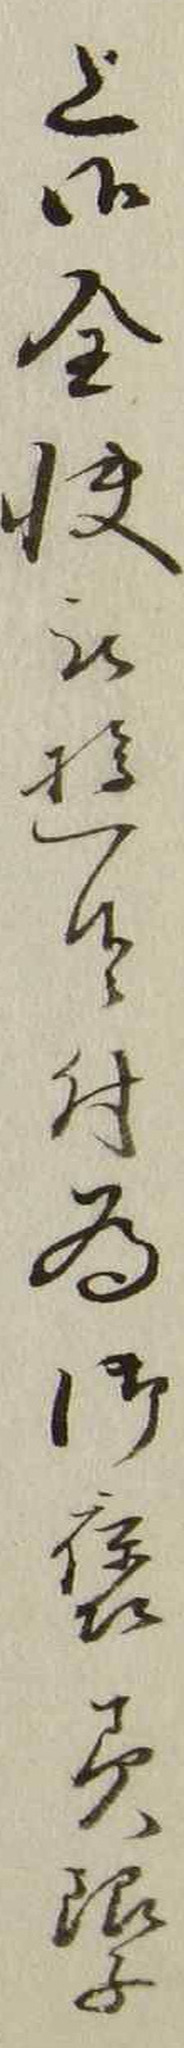上御全快被遊候ニ付為御褒美銀子
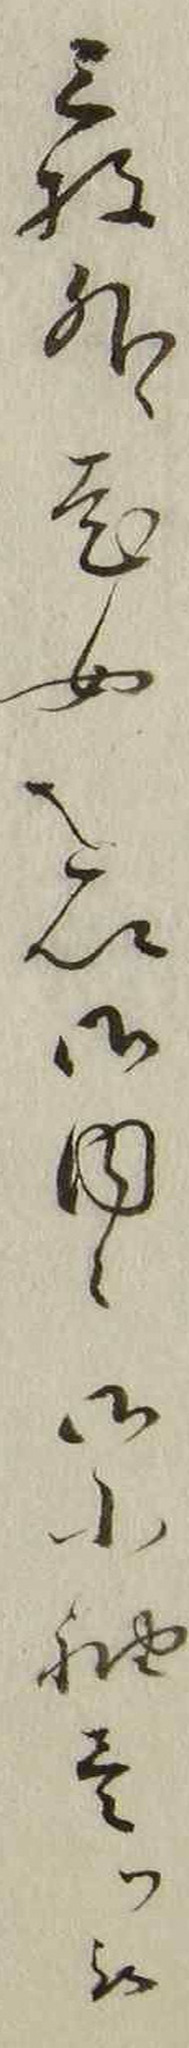壱枚外ニ老女を以御内々御小袖壱ツ被
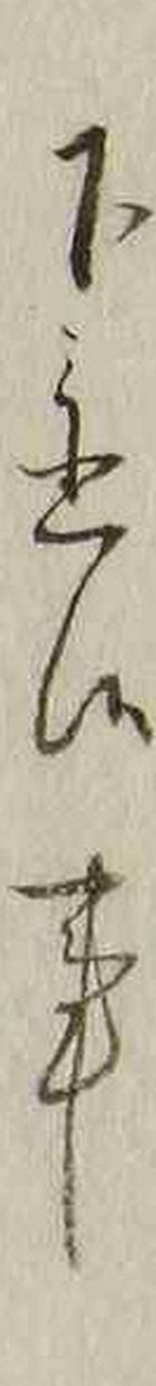下置候事
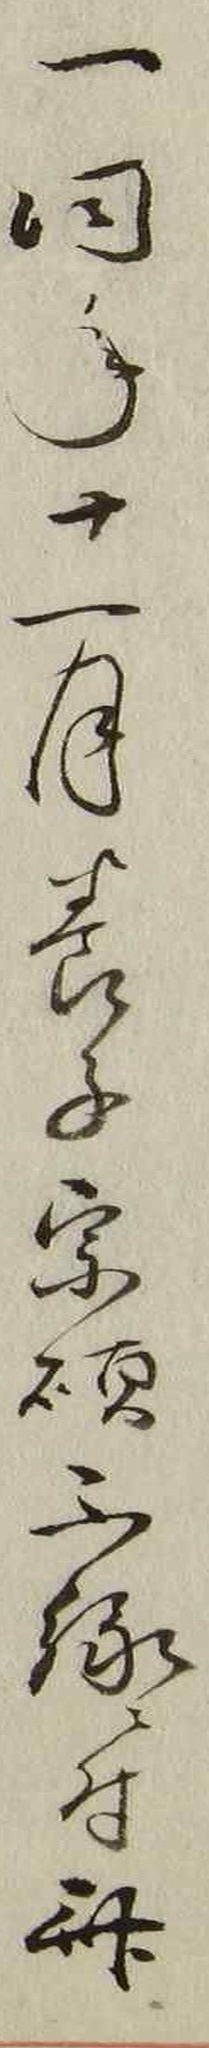一同年十一月養子宗硯不縁ニ付斎
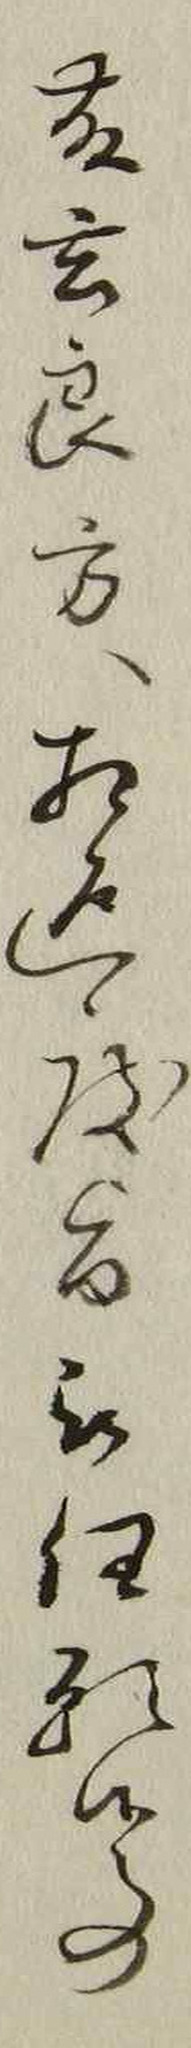藤玄良方へ相返度旨被任願候事
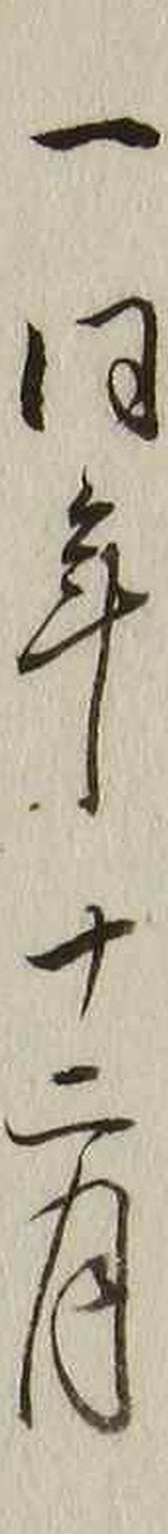一同年十二月
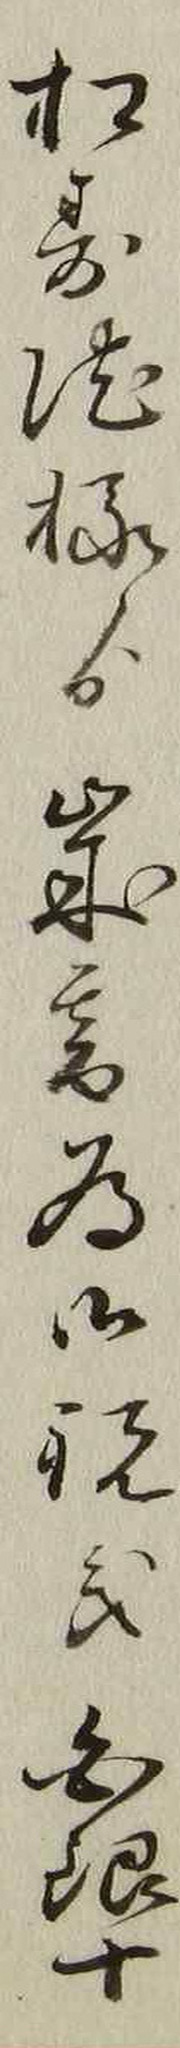松寿院様より歳暮為御祝儀白銀十
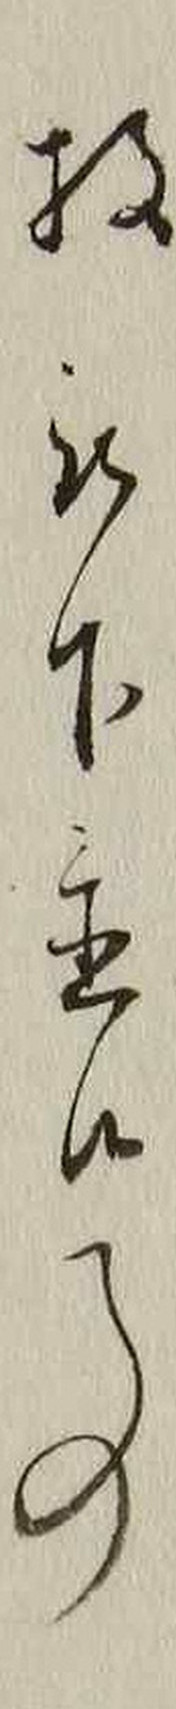枚被下置候事
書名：諸士系譜　巻之8　い之部8
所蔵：会津若松市立会津図書館
